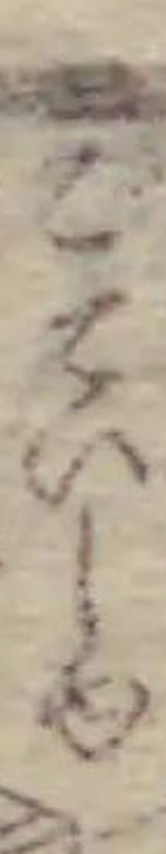ごていしゆ
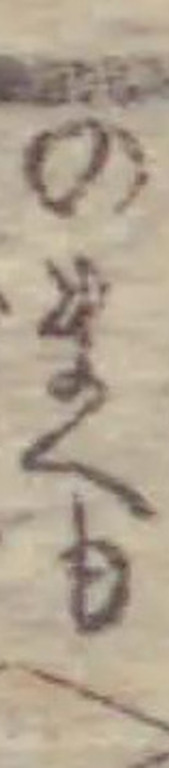のまへも
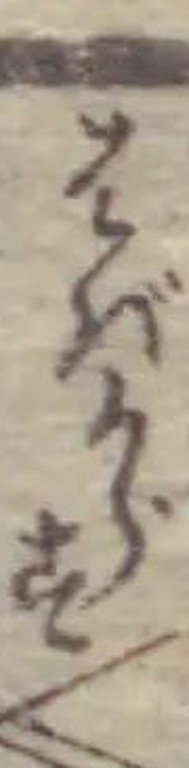はばからす
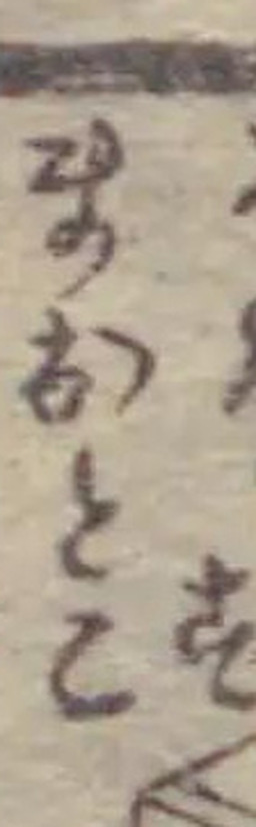まおとこ
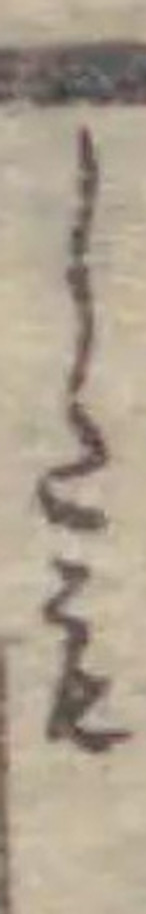したも
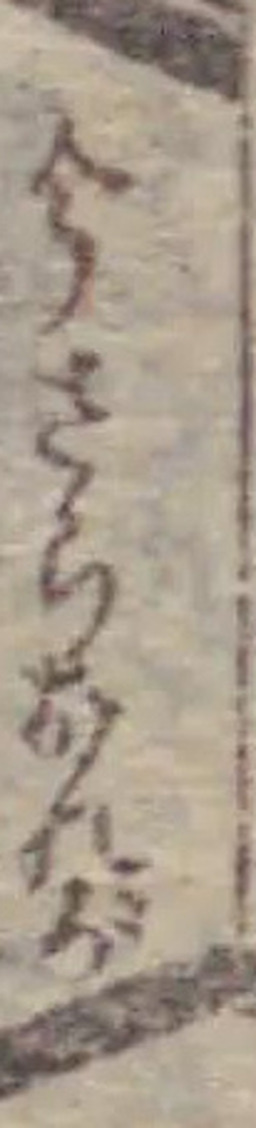今さらおれが
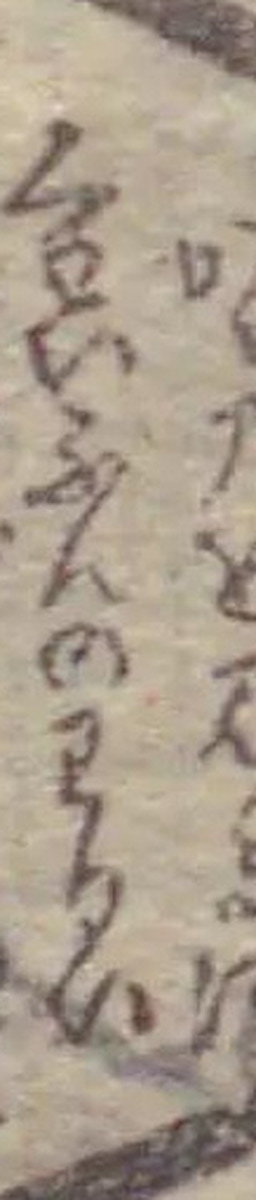くわいぶんのわるい
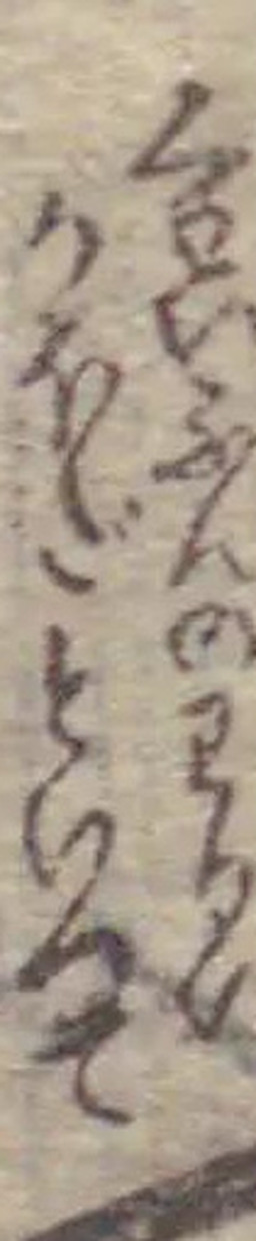かほだといつて
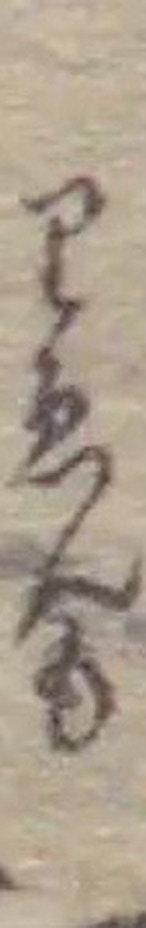りゑんも
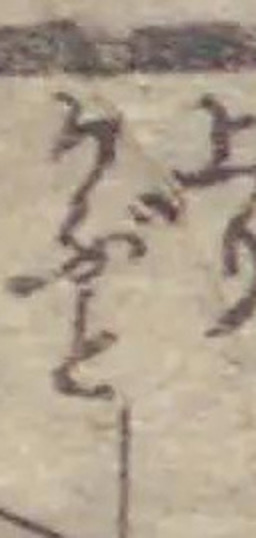かぶと
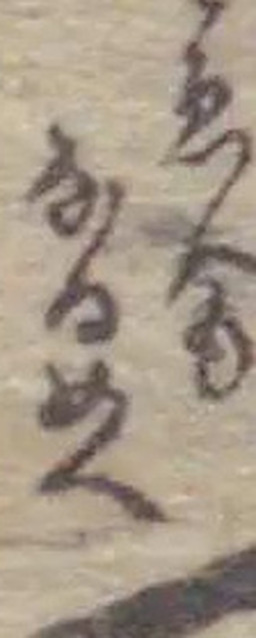なるめへ

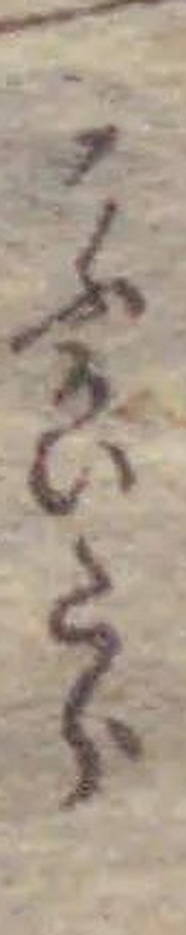こふかいたら
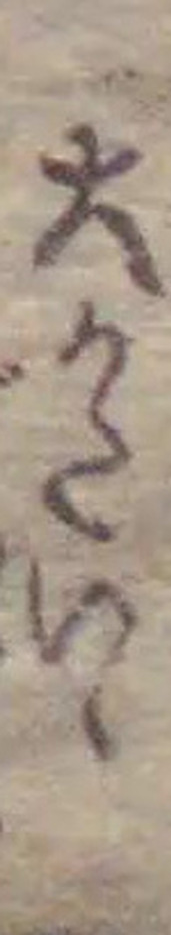大かたいゝ
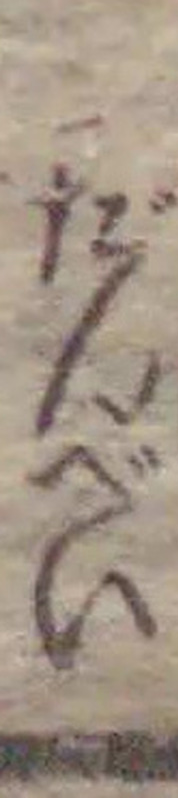だんべい
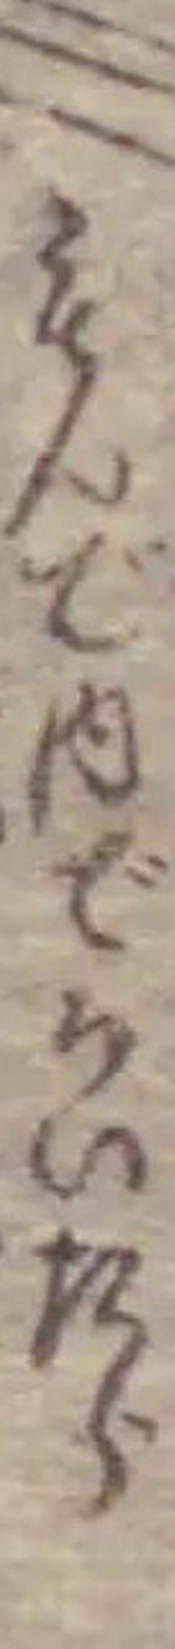もんで内でかいたら
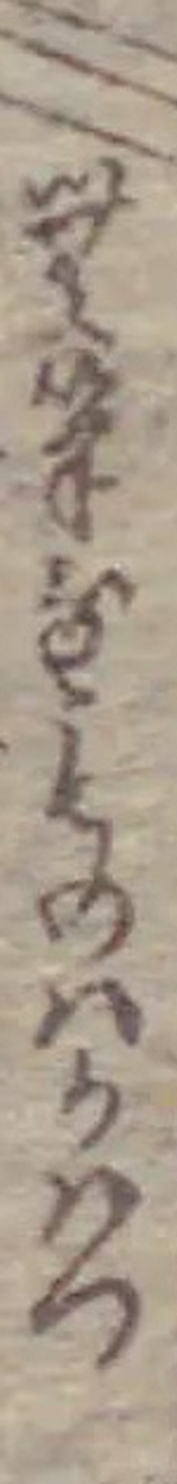無筆なものはかはつ
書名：栄増眼鏡徳 3巻
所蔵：国立国会図書館 National Diet Library, JAPAN
